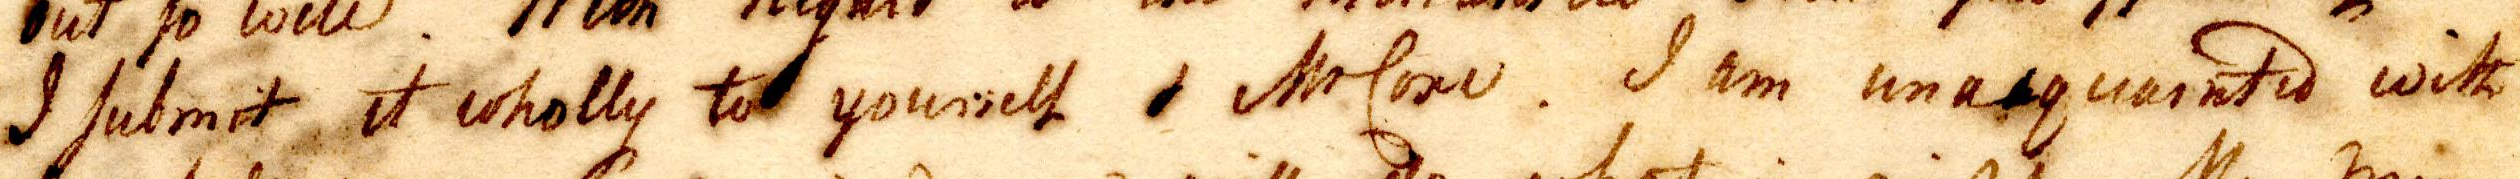I submit, it wholly to yourself & M^r Coxe. I am unacquainted with
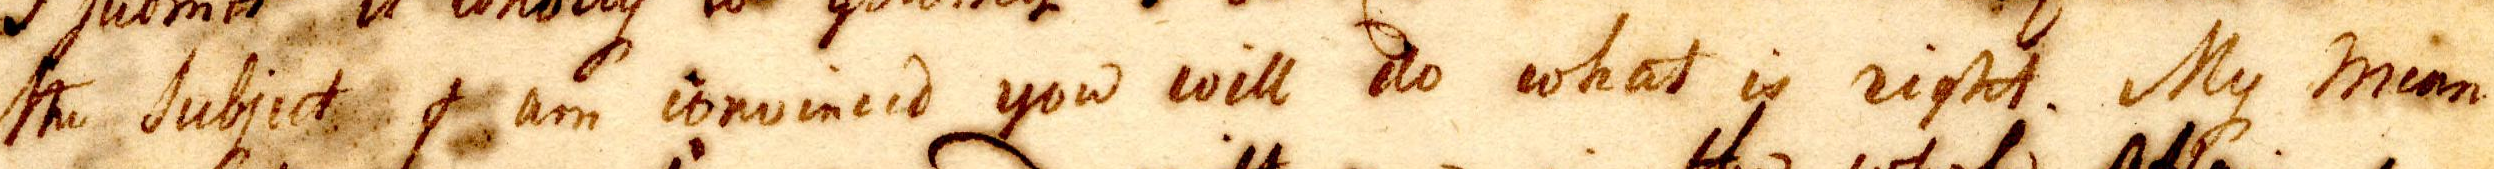the Subject & am convinced you will do what is right. My mean-
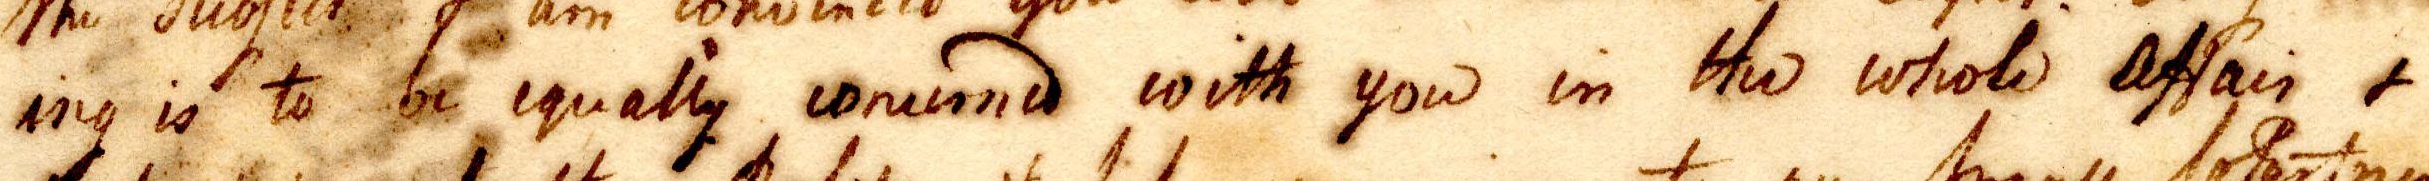-ing is to be equally concerned with you in the whole Affair &
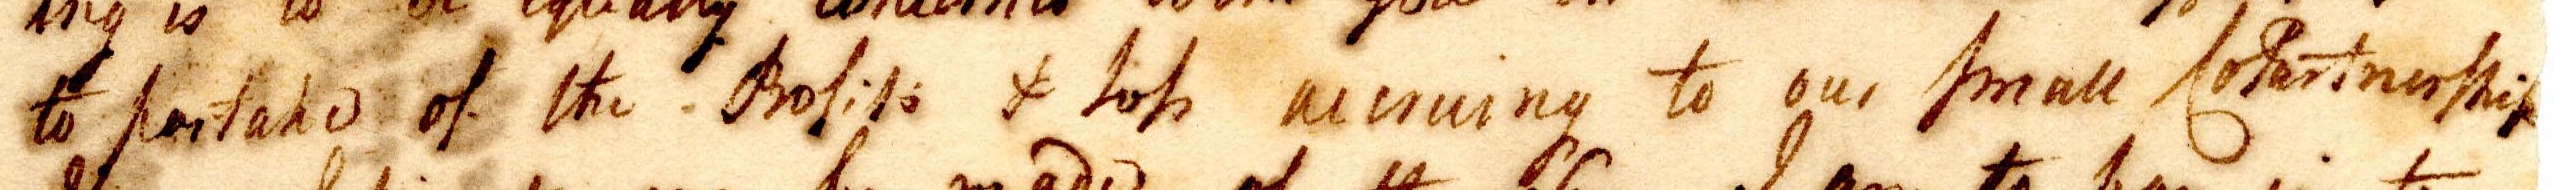to partake of the Profits & but accruing to our small Co-Partnership
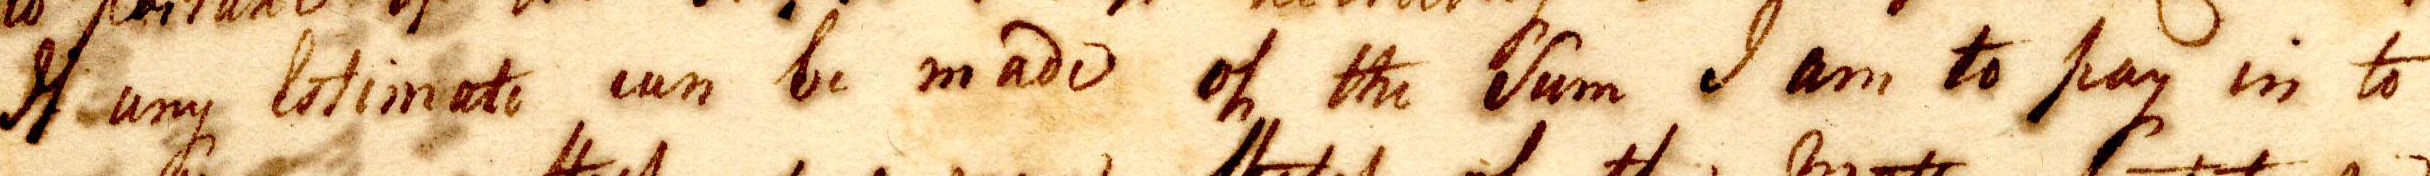If any Estimate can be made of the Sum I am to pay in to
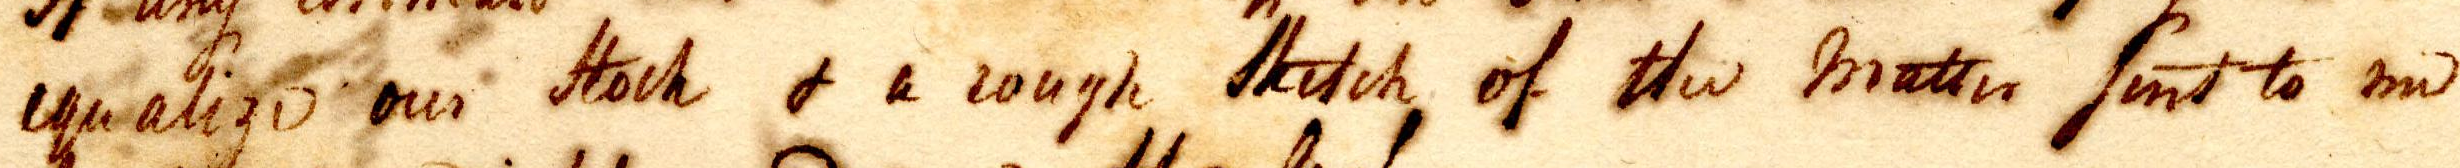equalize our Stock & a rough Sketch of the Matter Send to me
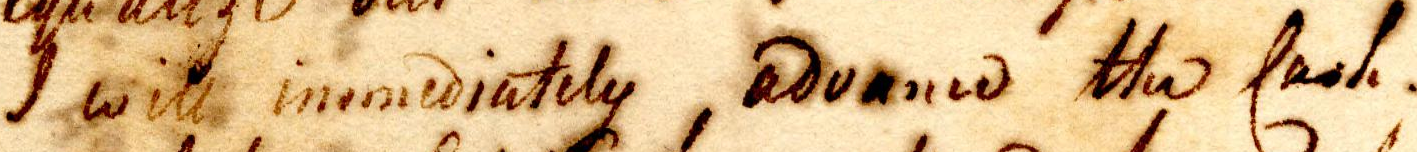I will immediately advance the Cash.
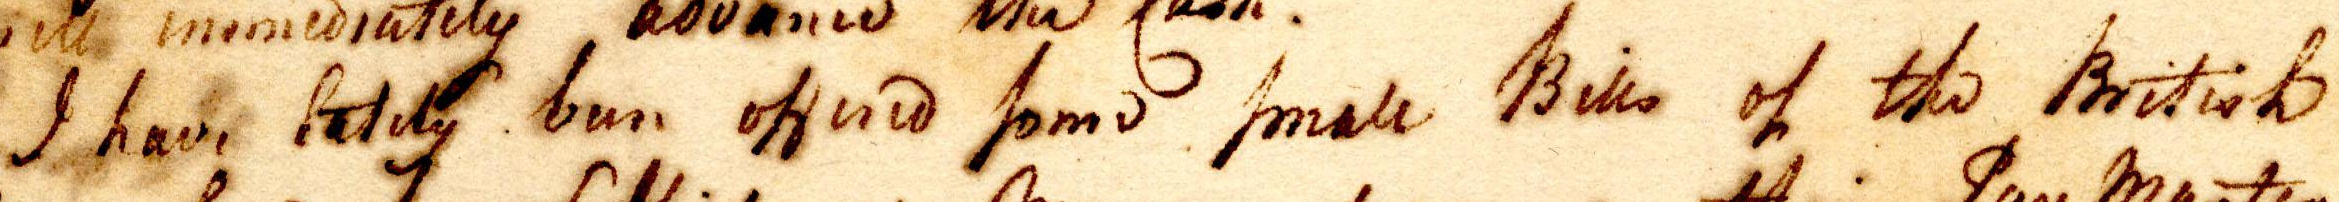I have lately been offered some small Bills of the British
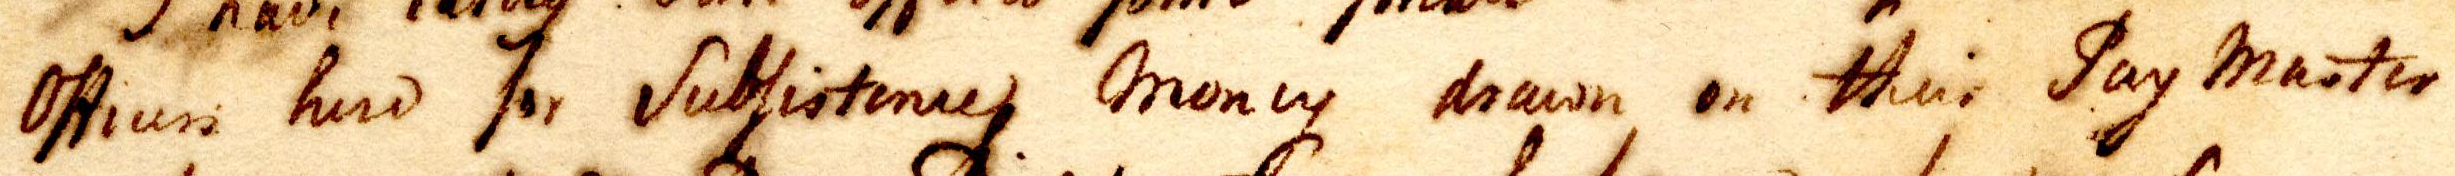Officers here for Subsistence Money, drawn on their Pay Master
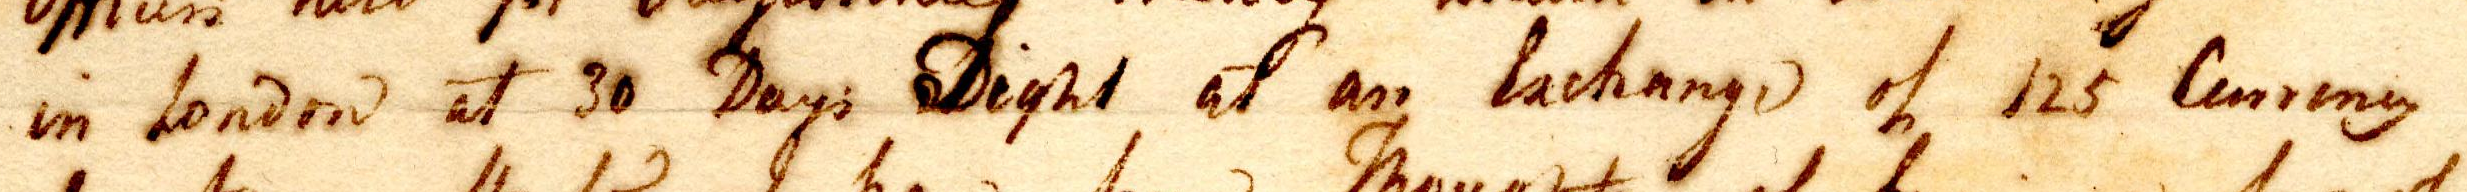in London at 30 Days Dight at an Exchange of 125 Currency
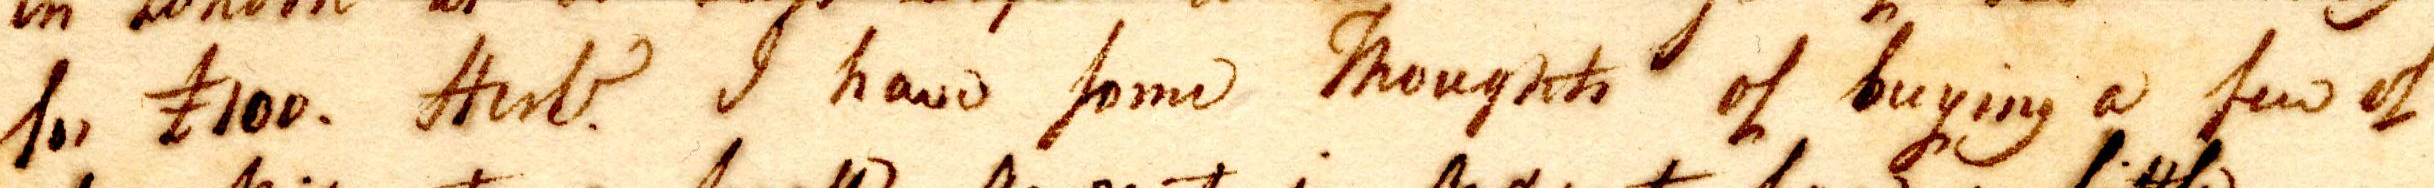for £100 Sterl. I have some thoughts of buying a few of
